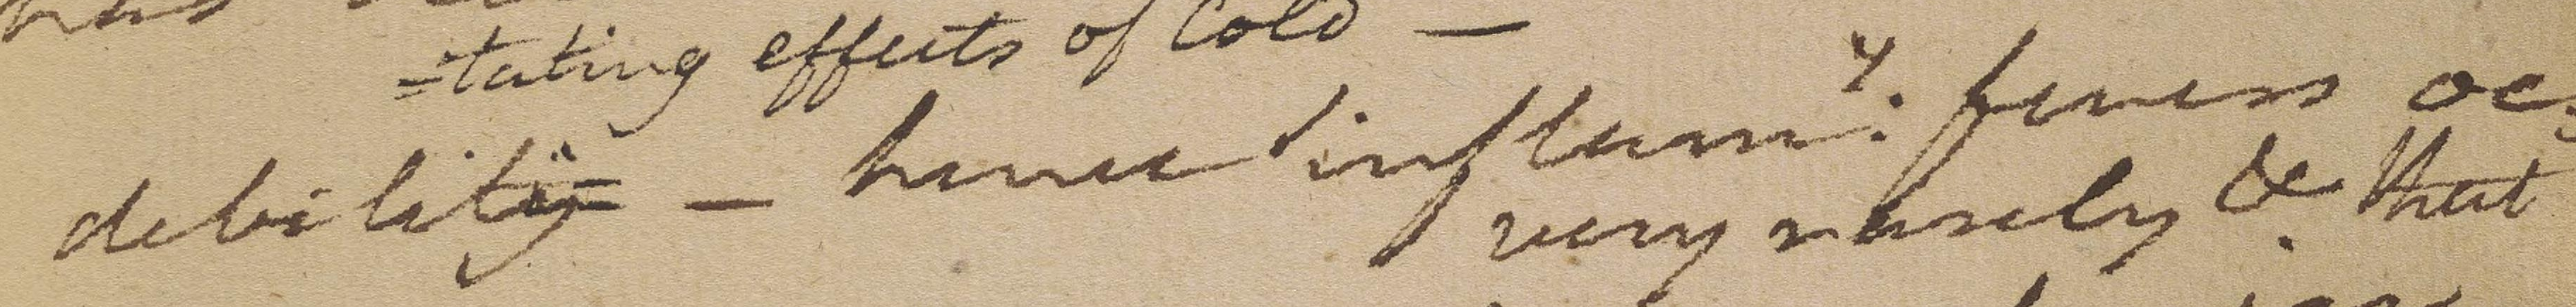debility, hence inflam^y fevers oc-
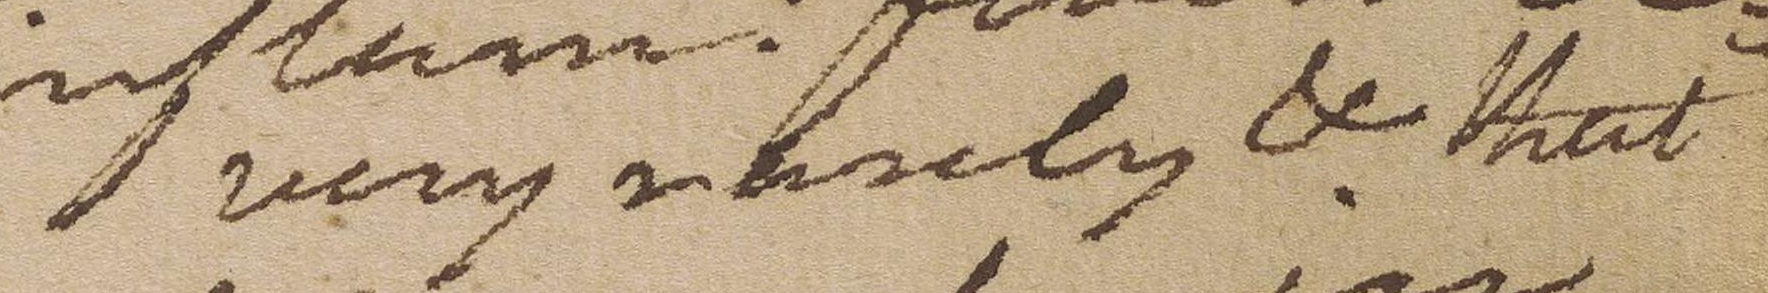very rarely & that
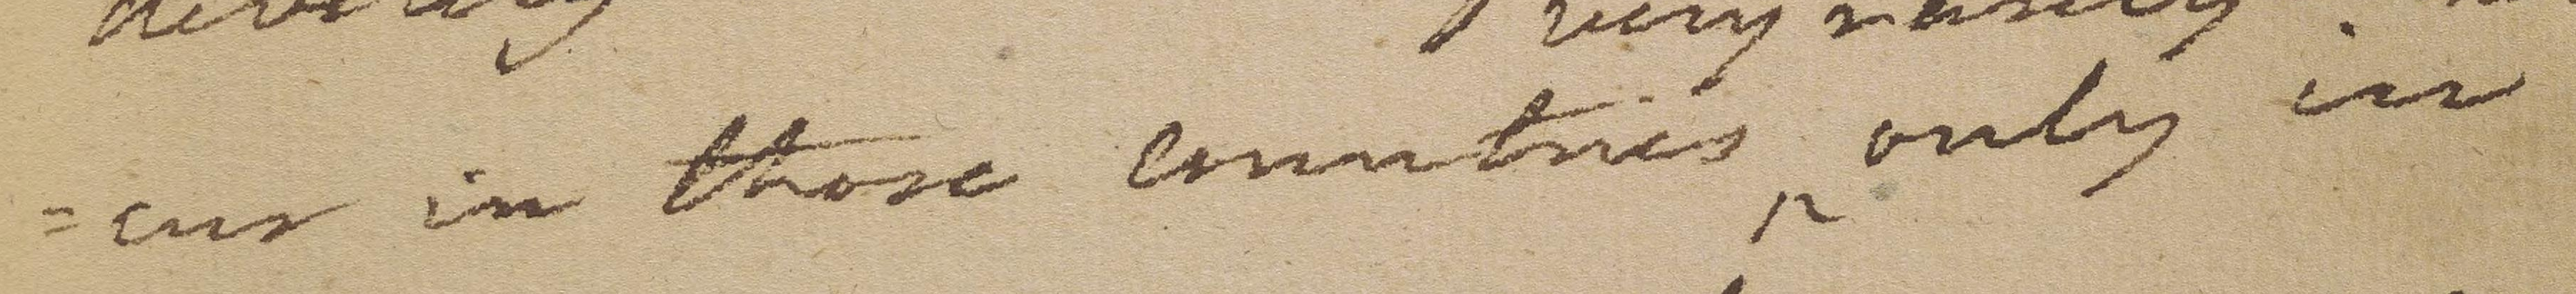-cur in those countries ^ only in
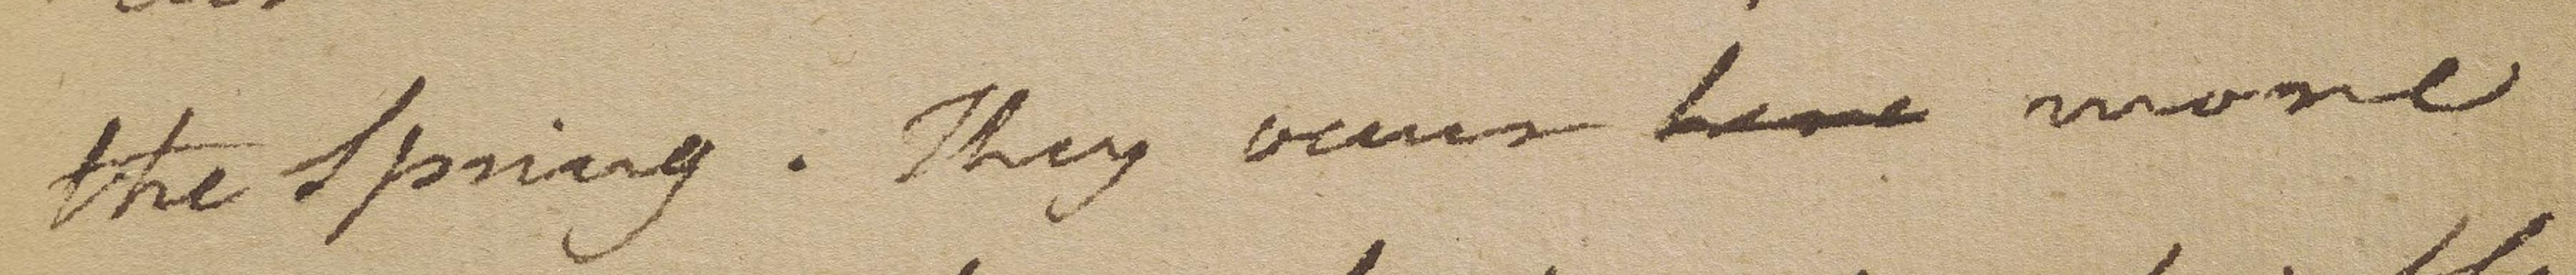the spring. They occur here more
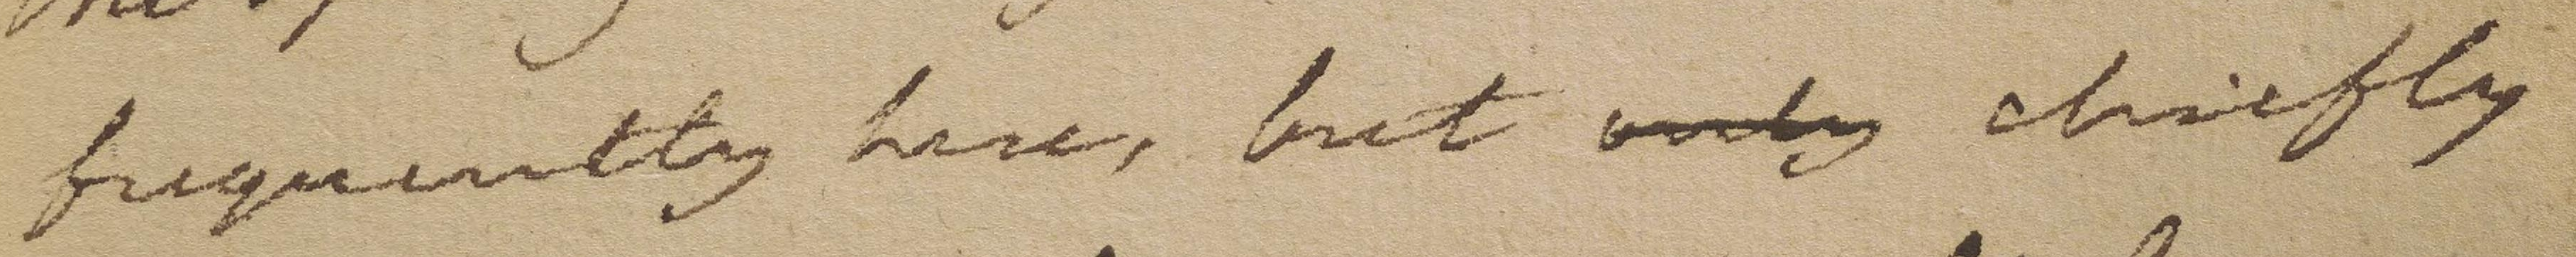frequently here, but [only] chiefly
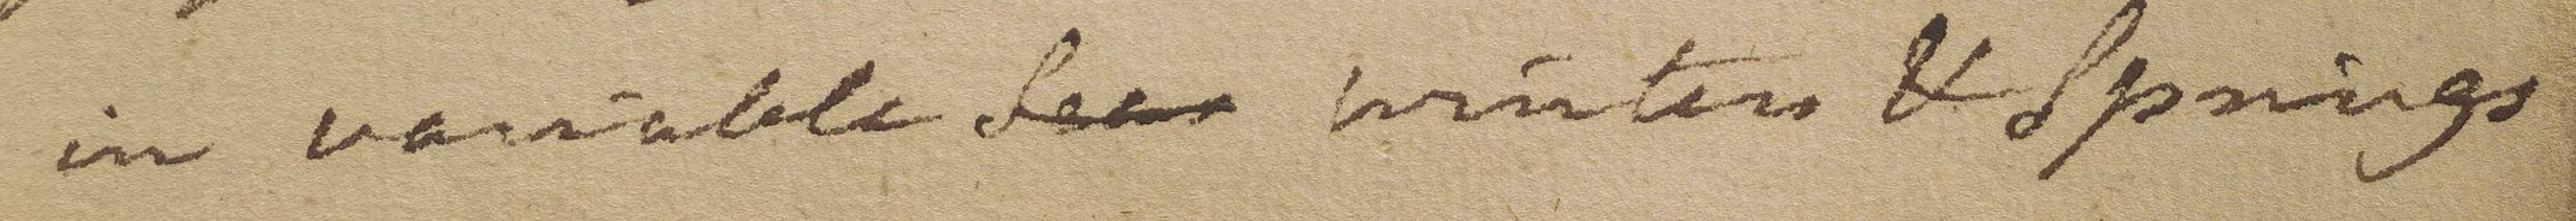in variable [Seas] winters & springs
